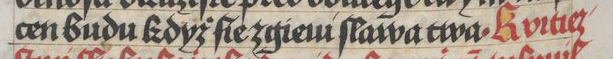ceen budu kdyż ſie zgieví ſlawa twa.K vitiez¬
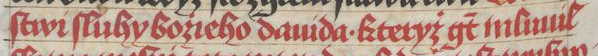ſtwi ſluhy bożielo davida.kteryż ḡt mluvil
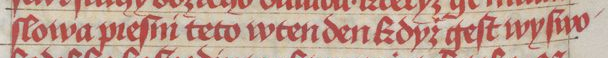ſlowa pieſni teto wten den kdyż geſt wyſwo¬
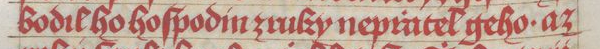bodil ho hoſpodin z ruky nepṙatel geho.a z
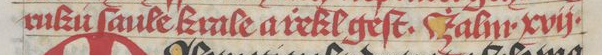ruku ſaule krale a ṙekl geſt.Żalm.xvij.
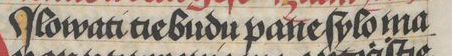Ylowati tie budu pane ſylo ma
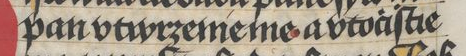pan utwrzenie me.a utoċiẛtie
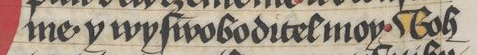me. y wyſwoboditel moy.Boh
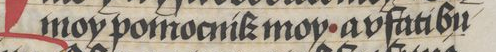moy pomocník moy.a ufati bu¬
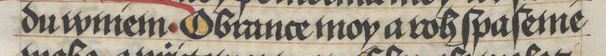du w niem.Obrance moy a roh ſpaſeníe
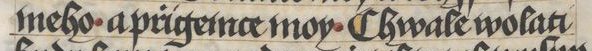meho.a pṙígemce moy.Chwale wolati
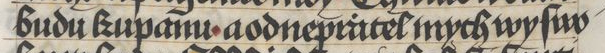budu ku panu.a odnepṙatel mych wyſwo¬
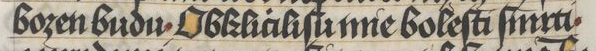bozen budu. Obkliċili ſu u mie boleſti ſmrti.
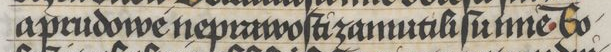A prudowé neprawoſti zamutili ſtu me.Bo¬
